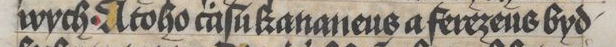wych.A toho ċaſu kananeus a ſerezeus byd¬
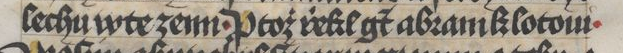lechu wte zemi.Ꝓtoż ṙekl ḡt abram klotoui.
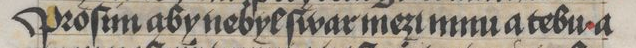Proſim aby nebyl ſwar mezi mnu a tebu.a
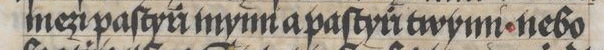mezi paſtyṙi mymí a paſtyṙi twymi.nebo
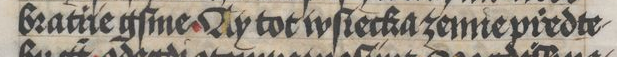bratříe gſme.Ay tot wẛiecka zemie pṙedte¬
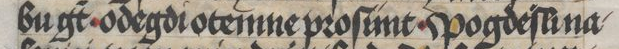bu ḡt.odegdi otemne proſimt.Pogdeẛli na¬
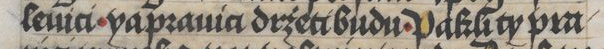leuici.ya prauici drżeti budu.Pakli ty pra¬
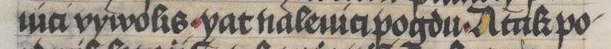uici vywolis.yat naleuici pogdu.A tak po¬
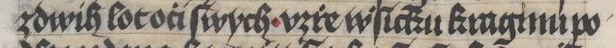zdwih lot oċí ſwych.vzṙe wẛicku kraginu po¬
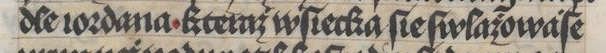dle iordana.kteraż wẛiecka ſie ſwlażowaẛe
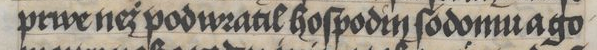prwe neż podwratil hoſpodin ſodomu a go¬
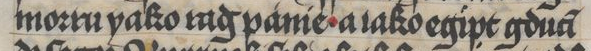mozru yako rak pánie.a iako egipt gducī
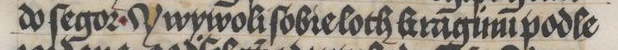do ſegož.Y wywoli ſobie loth kragimu podle
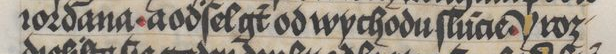iordana.a odẛel ḡt od wychodu ſlūcie.Y roz¬
